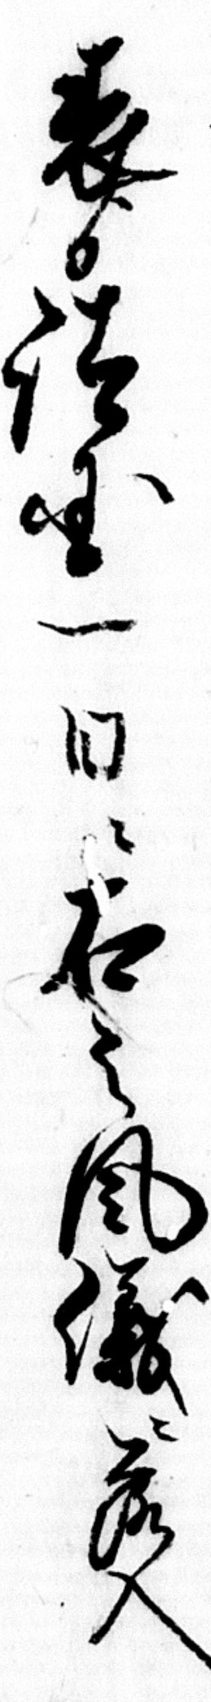表ゟ諸国一日に右之風儀に落入
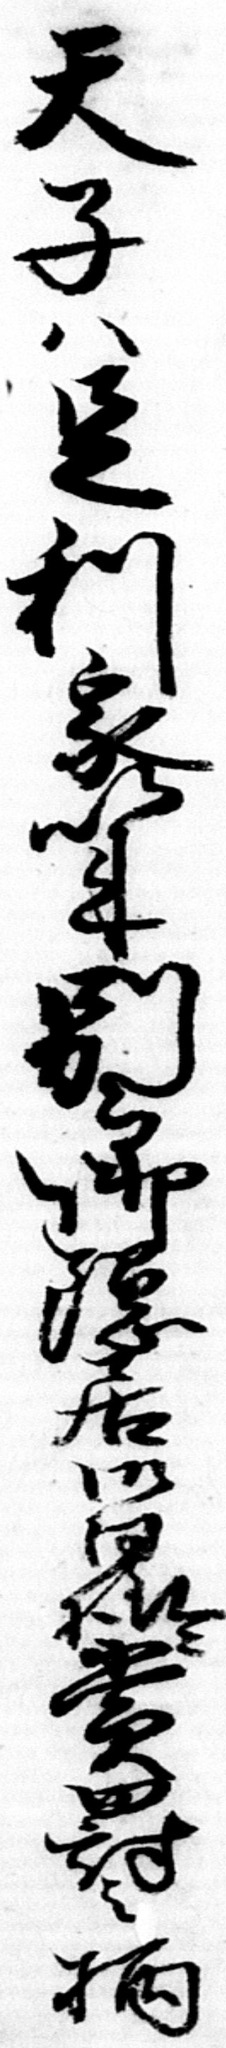天子は足利家以来別而御隠居御同様に賞罰之柄
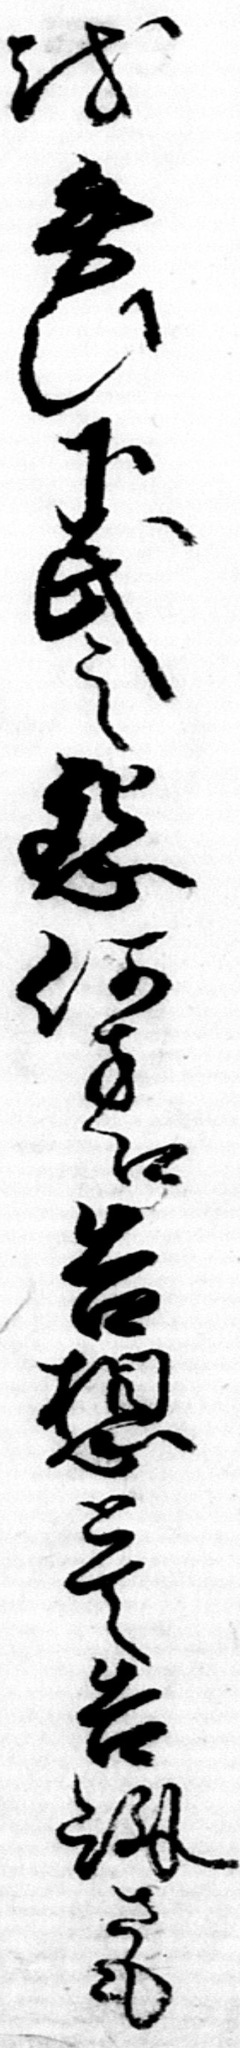を失ひ下民之怨何方え告想とて告訴さも
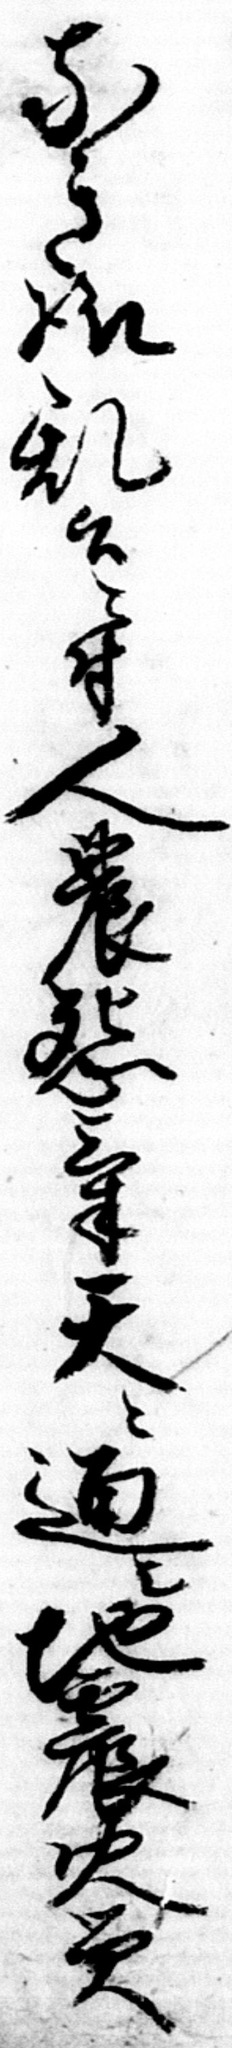なき様乱候に付人農怨気天に通し地震火災

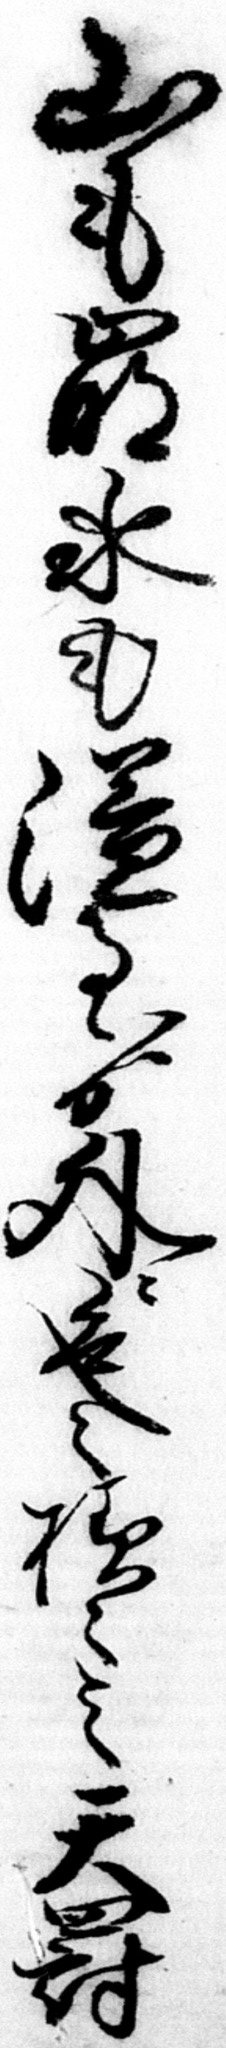山も崩水も溢るゝゟ外に色々様々之天罰
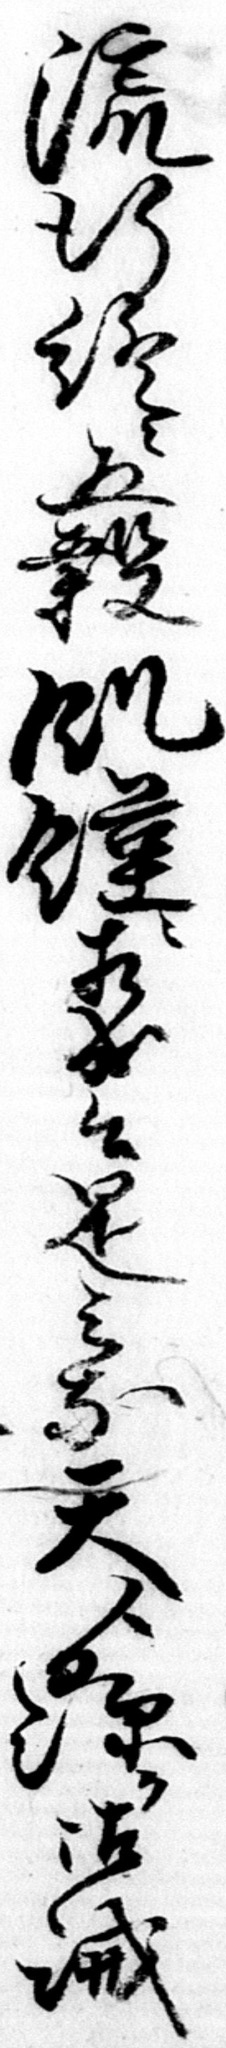流行終に五穀飢饉に相成候是みな天ゟ深く御誡
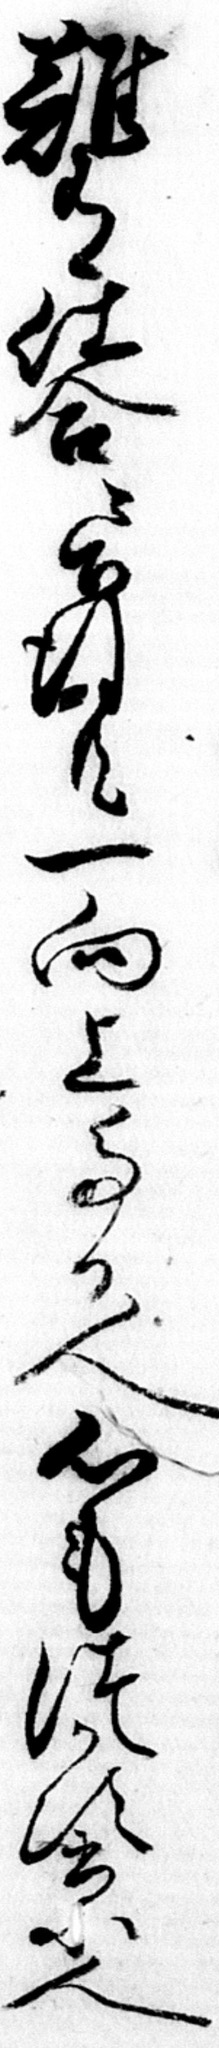難有仕合に候得共一向上たる人心もつかす尚小人
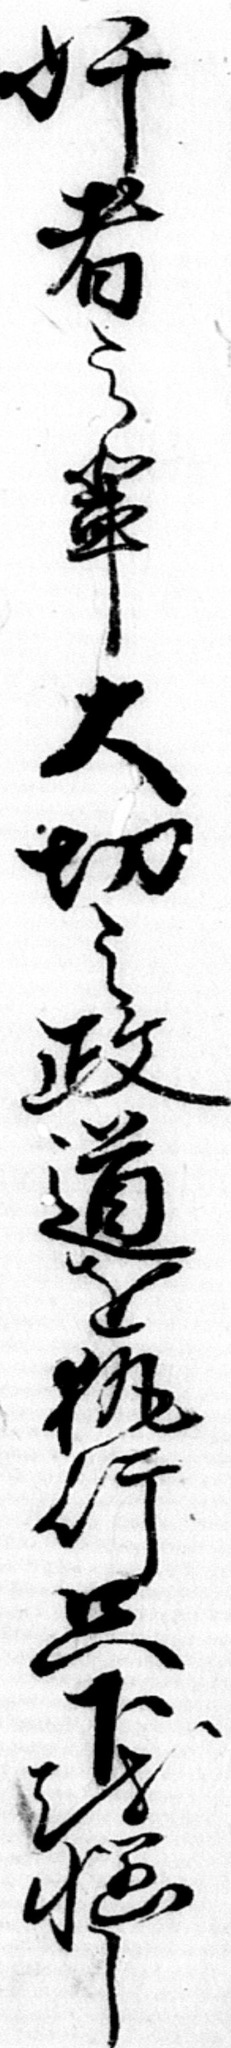奸者之輩大切之政道を執行只下を悩し
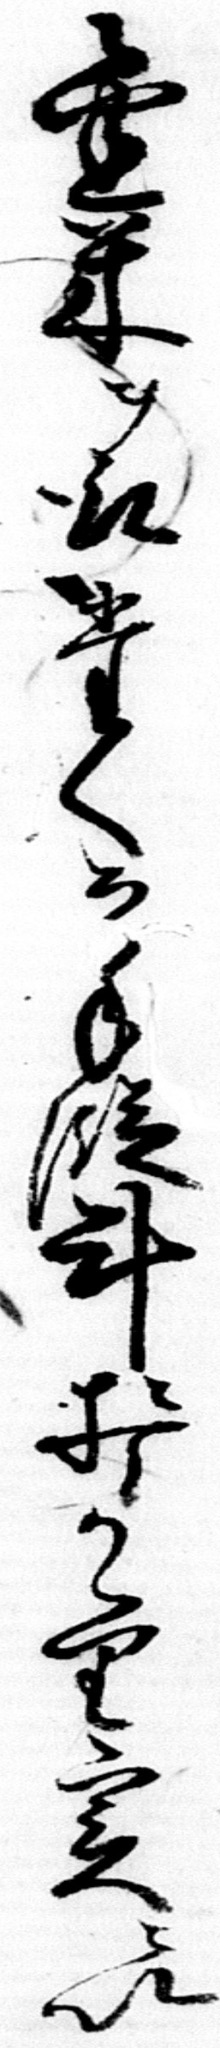金米を取たてる手段計に打かかり実に以
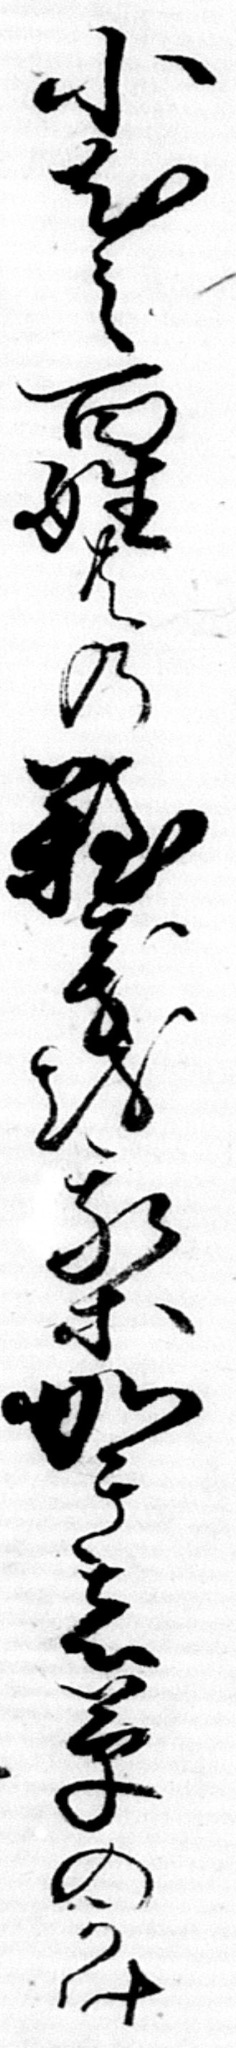小前之百姓共の難義を我等如き者草のかけ
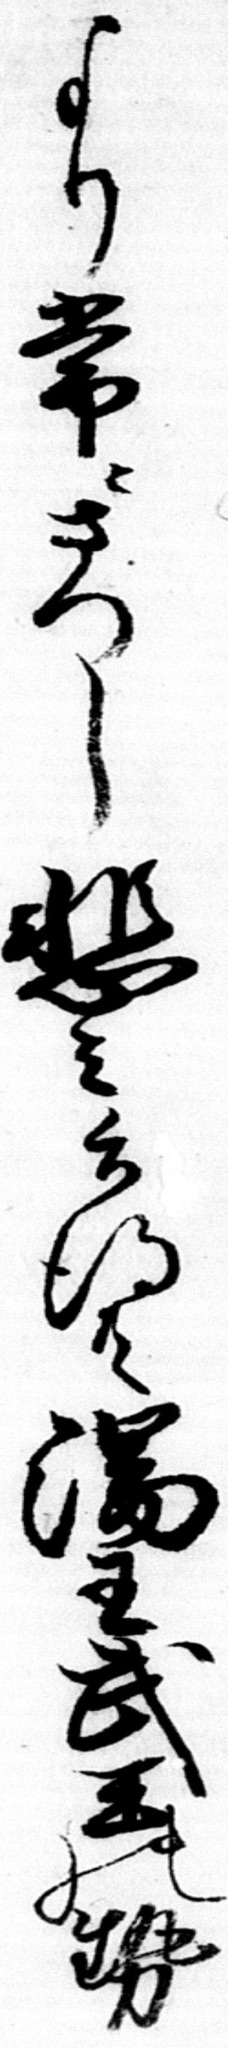より常にさつし悲み候得共湯王武王の勢
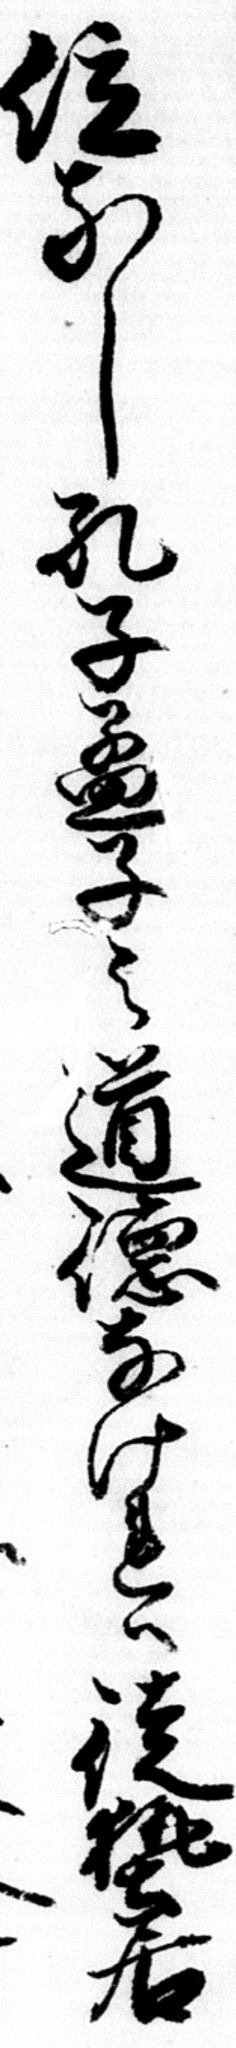位なし孔子孟子之道徳なけれは徒蟄居
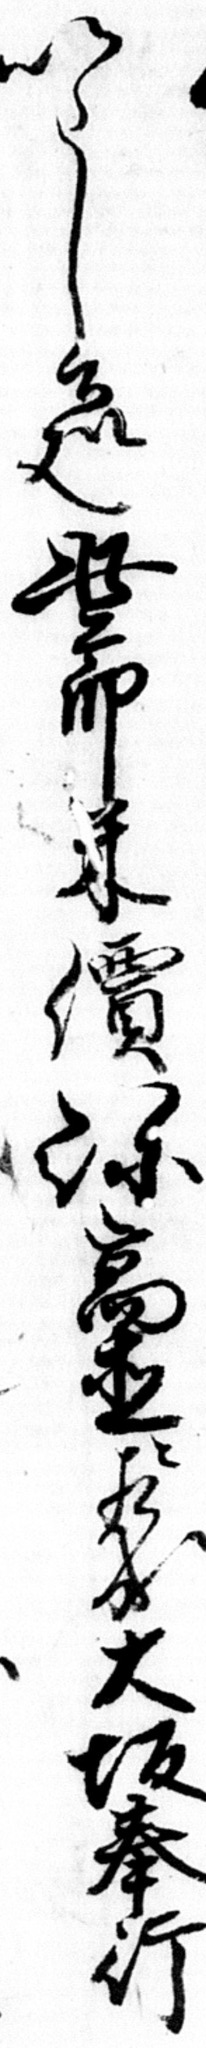いたし候処此節米価弥高直に相成大坂奉行
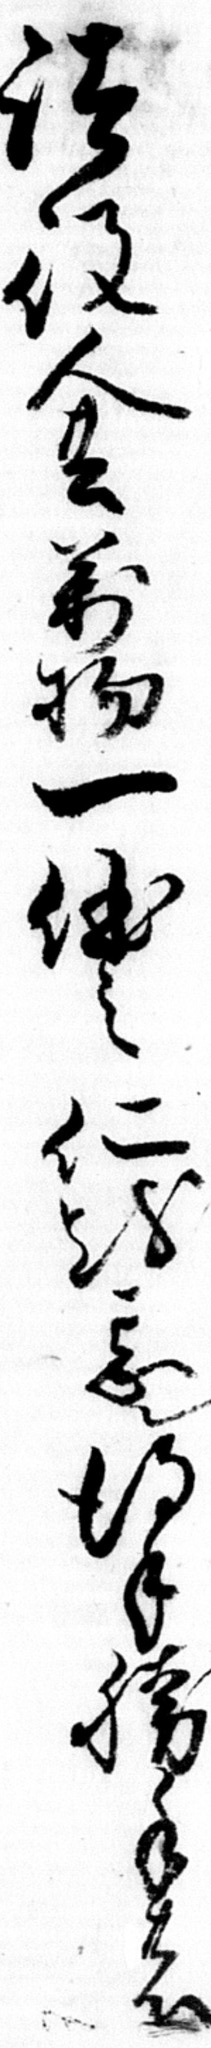諸役人共万物一体之仁を忘れ得手勝手の
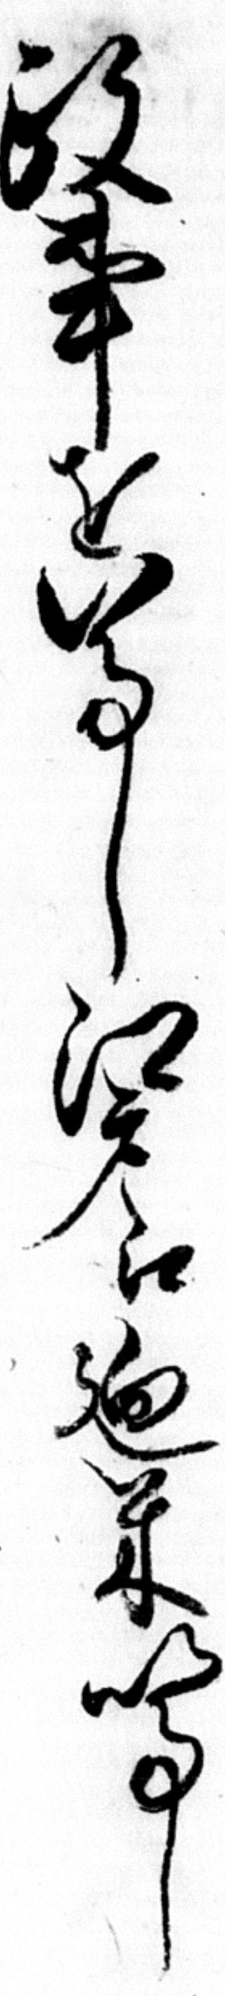政事をいたし江戸え廻米いたし

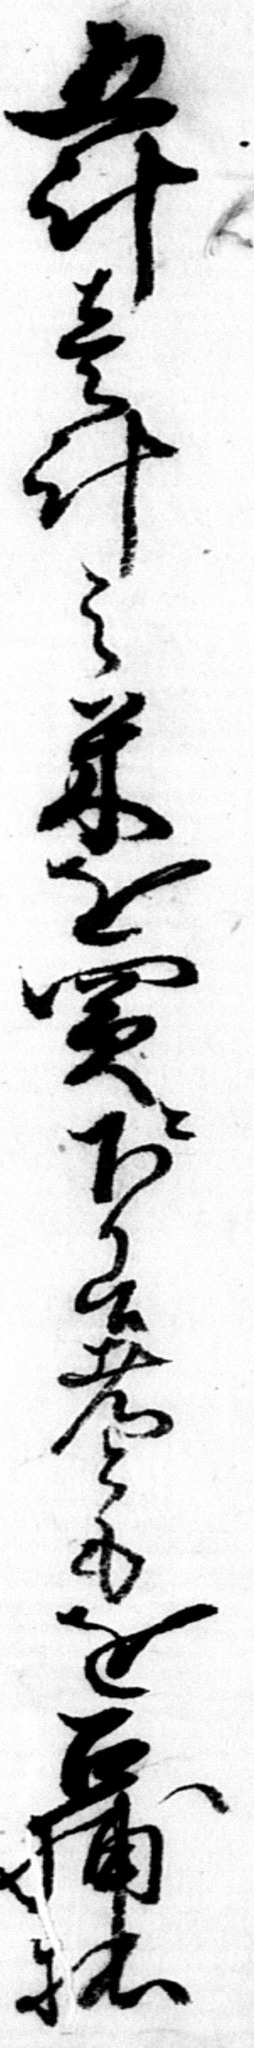五斗壱斗之米を買に下り候者ともを召捕抔
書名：大坂一件大塩平八郎存書
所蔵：徳島県立図書館
